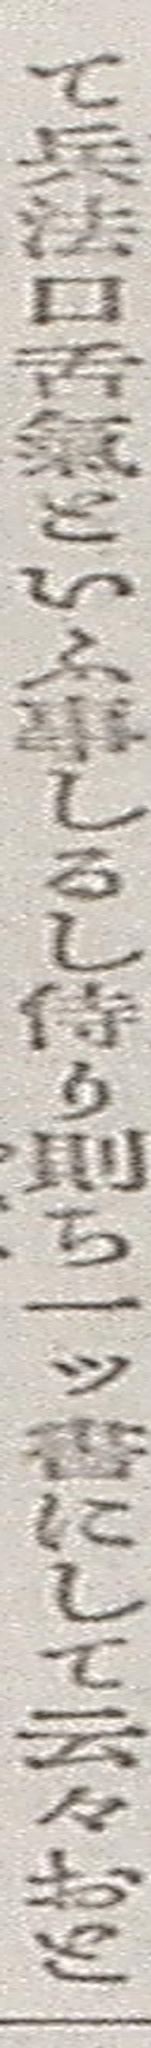て兵法口舌気といふ事しるし侍り則ち一ッ書にして云々おと
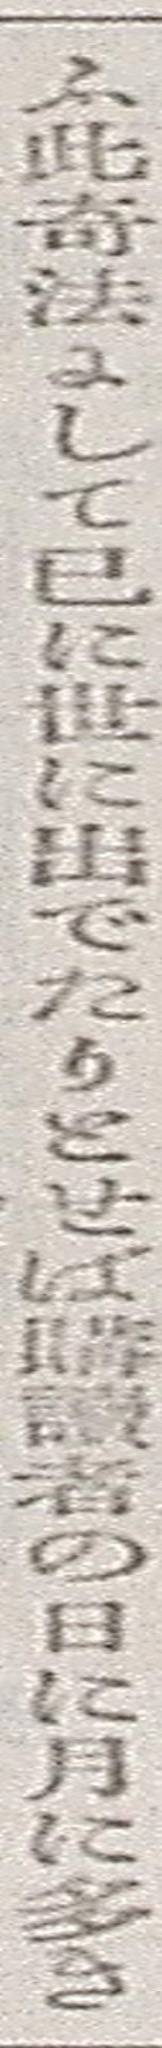ふ此奇法にして已に世に出でたりとせば購読者の日に月に多き
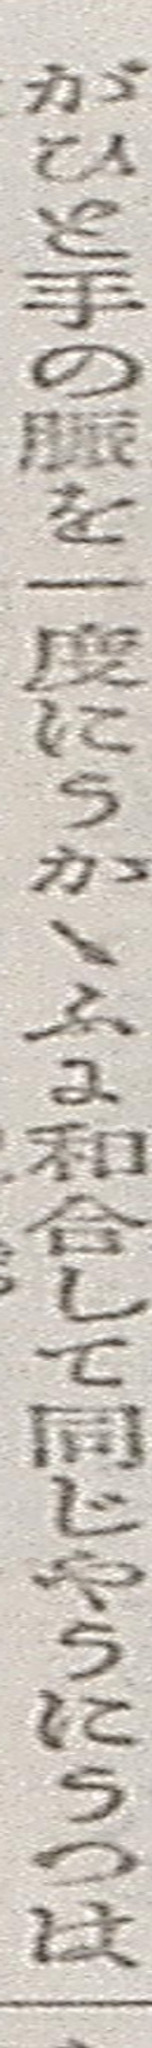がひと手の脈を一度にうかゝふに和合して同じやうにうつは
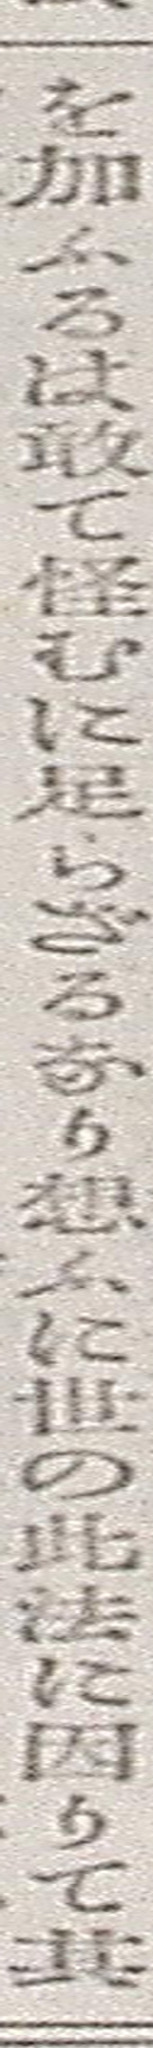を加ふるは敢て怪しむに足らざるなり想ふに世の此法に因りて其
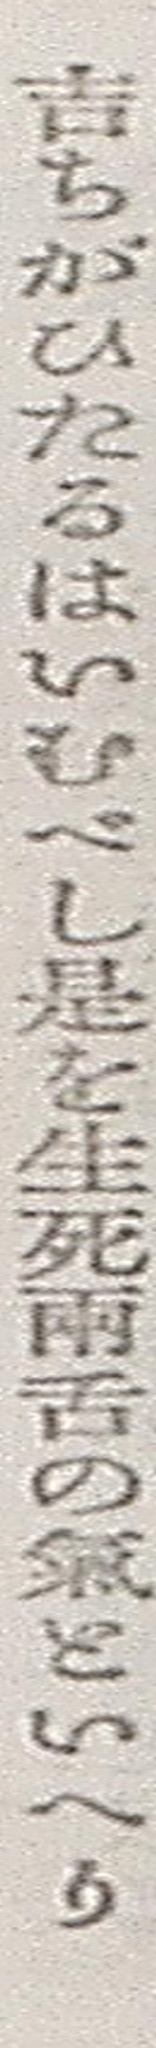吉ちがひたるはいむべし是を生死両舌の気といへり
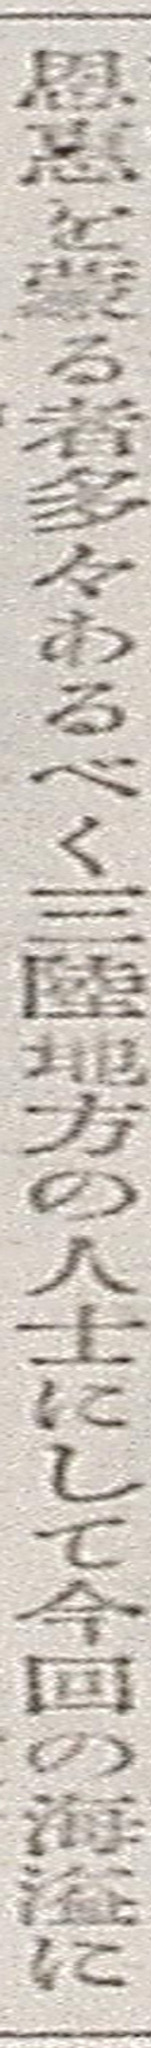恩恵を蒙る者多々あるべく三陸地方の人士にして今回の海溢に
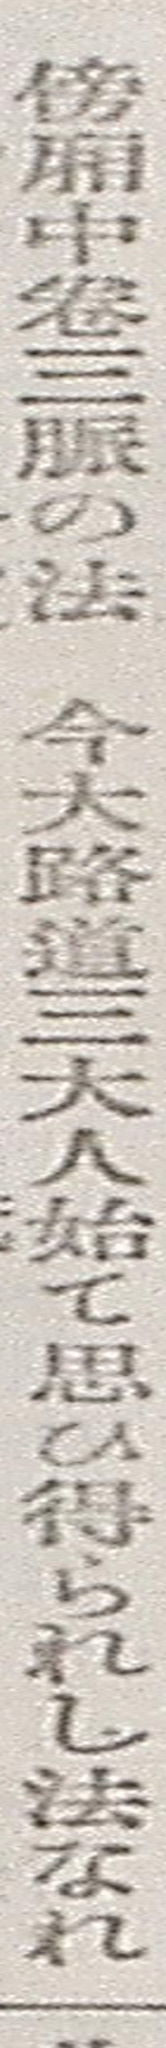傍廂中巻三脈の法今大路道三大人始て思ひ得られし法なれ
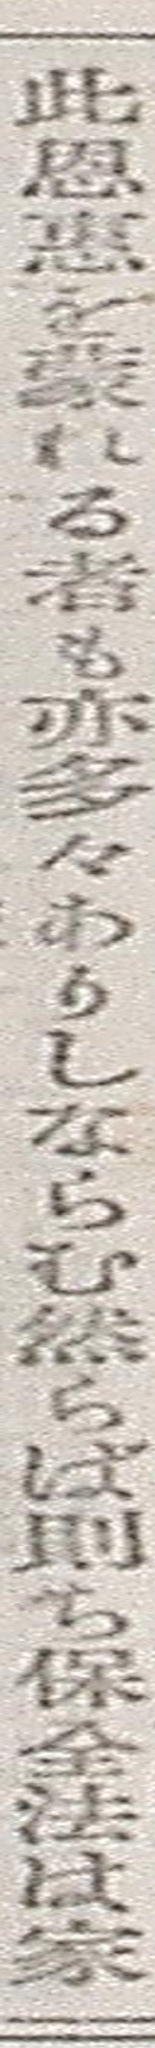此恩恵を蒙れる者も亦多々ありしならむ然らば則ち保全法は家
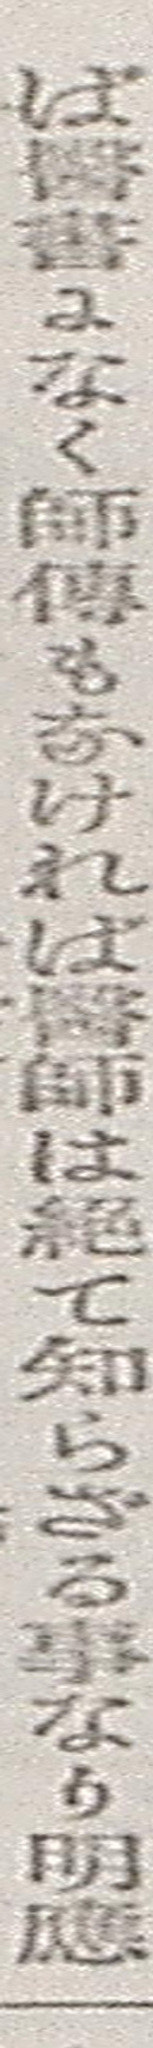医書になく師伝もなければ医師は絶て知らざる事なり明応
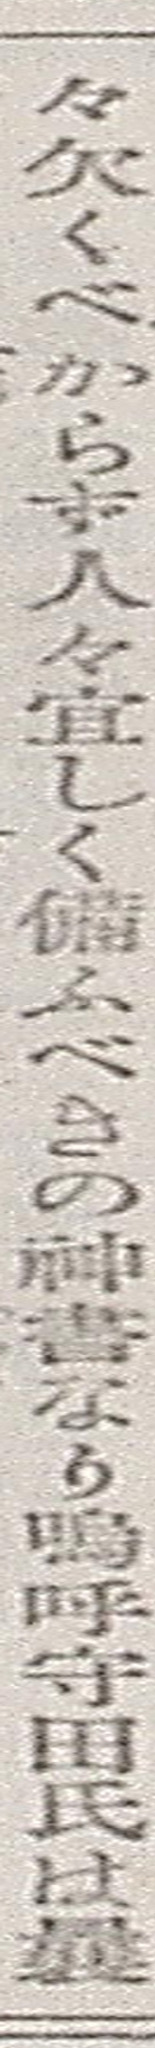々欠くべからず人々宜しく備ふべきの神書なり嗚呼守田氏は曩
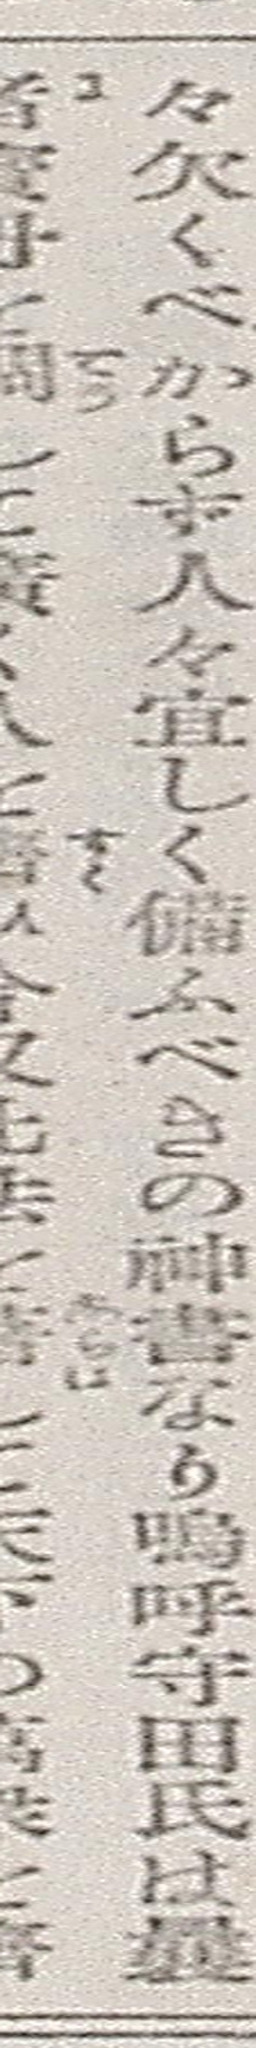者宝丹を調して広く人を済ひ今又此法を著して天下の万衆を済
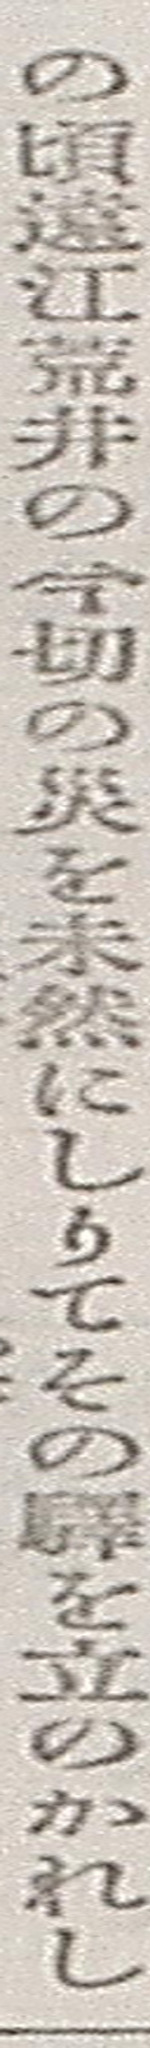の頃遠江荒井の今切の災を未然にしりてその駅を立のかれし
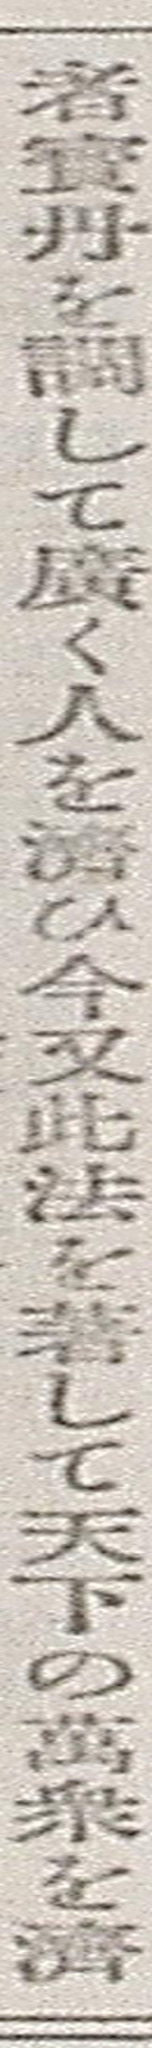者宝丹を調して広く人を済ひ今又此法を著して天下の万衆を済
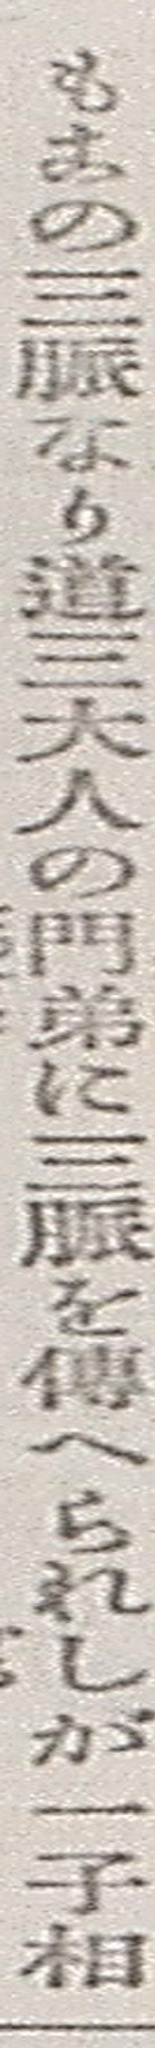もこの三脈なり道三大人の門弟に三脈を伝へられしが一子相
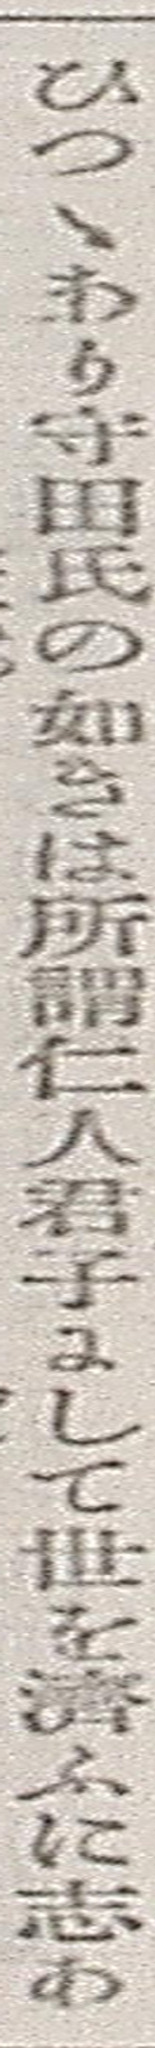ひつゝあり守田氏の如きは所謂仁人君子にして世を済ふに志あ
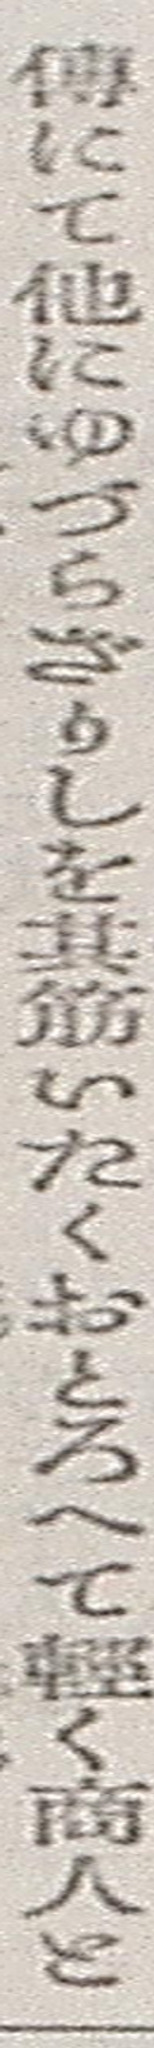伝にて他にゆづらざりしを其筋いたくおとろへて軽く商人と
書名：風俗畫報臨時増刊第百二十號　大海嘯被害録（下）
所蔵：東京大学地震研究所図書室 Earthquake Research Institute Library, The University of Tokyo, JAPAN
